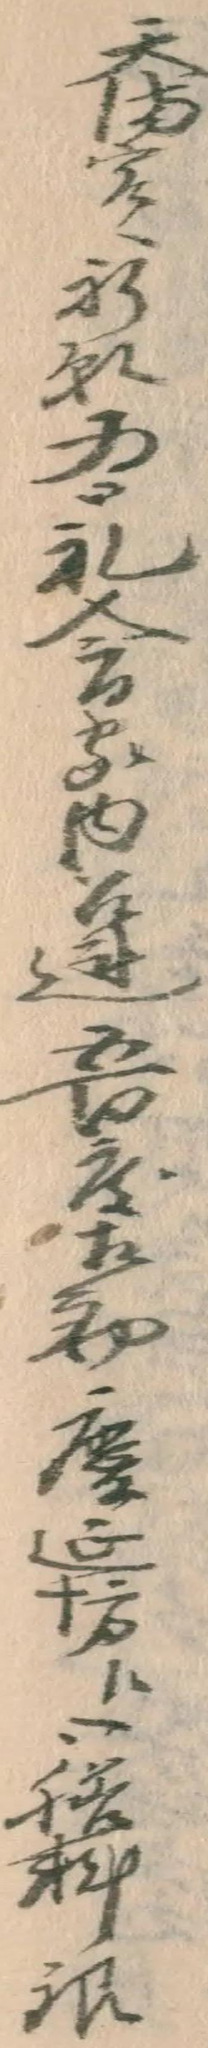天満宮へ祈願為御礼今日家内召連五百度相勤慶延坊え御膳料銀
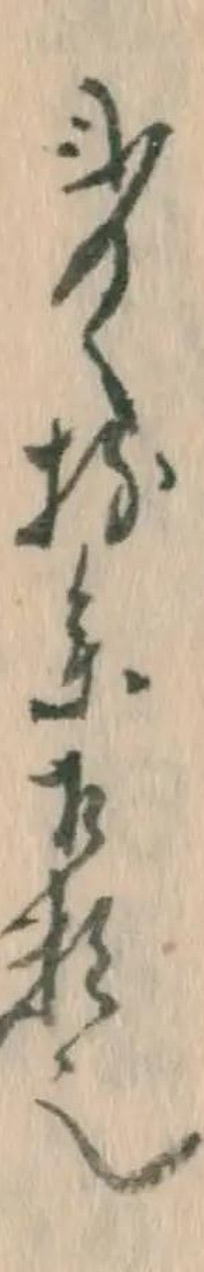弐匁持参相頼也
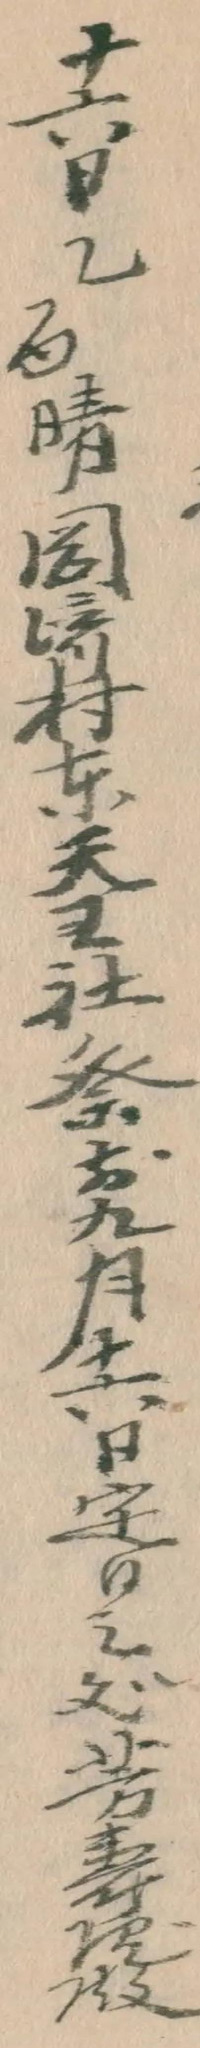十六日乙酉晴岡崎村東天王社祭於九月十六日定日之処芳壽院殿
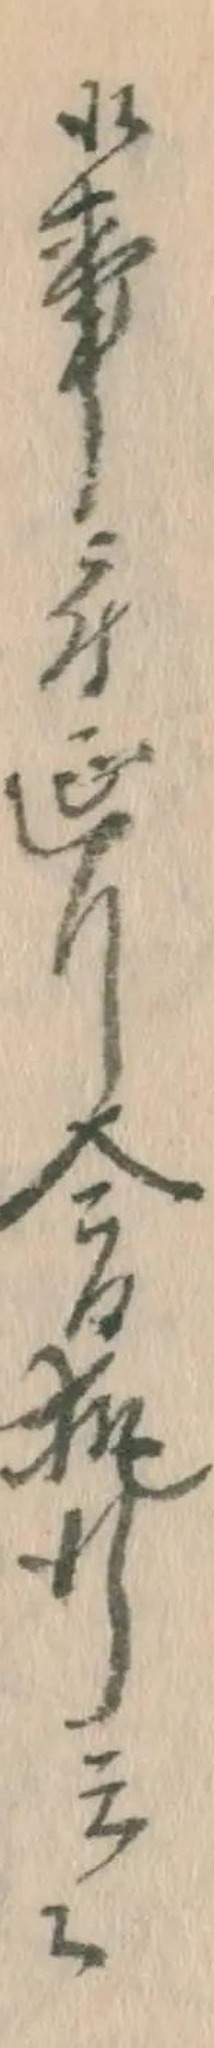非事ニ付延引今日執行云々
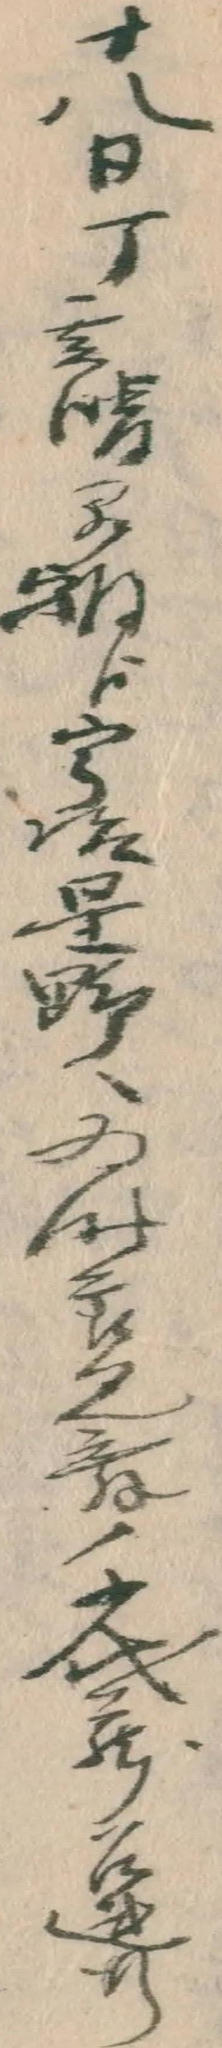十八日丁亥晴早朝ゟ宇治星野へ為時節見舞千代蔵召連行
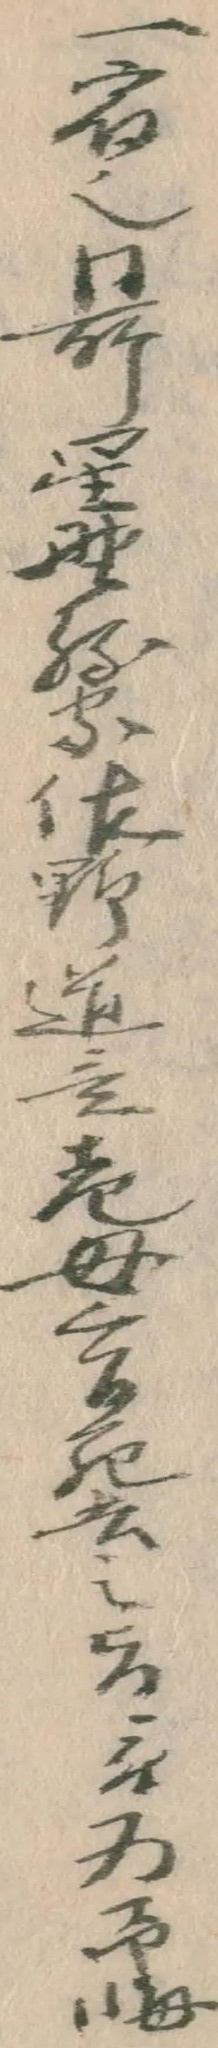一宿也同所星野孫家佐野道玄老母今日死去之旨ニ付為弔悔
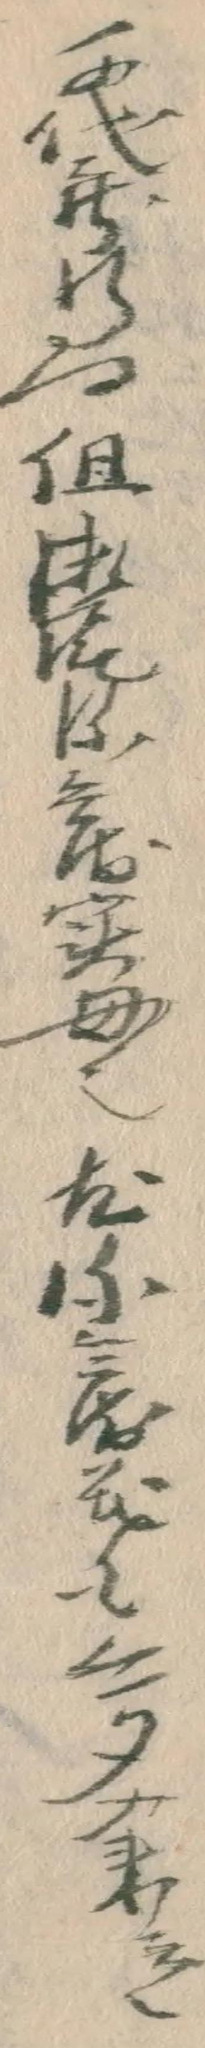千代蔵行向但瀬尾弥兵衛実母也尤弥兵衛義も今夕入来云々
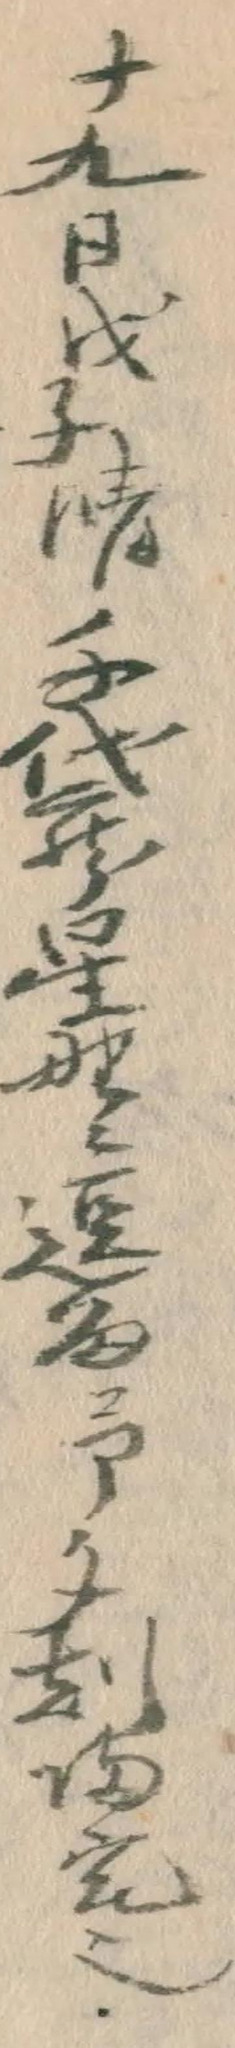十九日戊子晴千代蔵星野ニ逗留予夕刻帰宅也
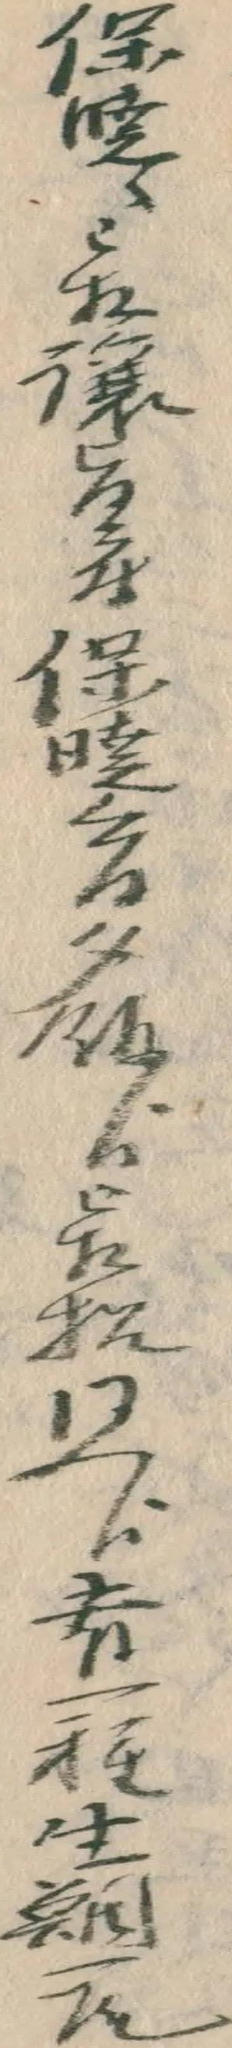保暁ヘ被相譲旨ニ付保暁旨夕飯ゟ被相招同人ゟ肴一種生鯛一段
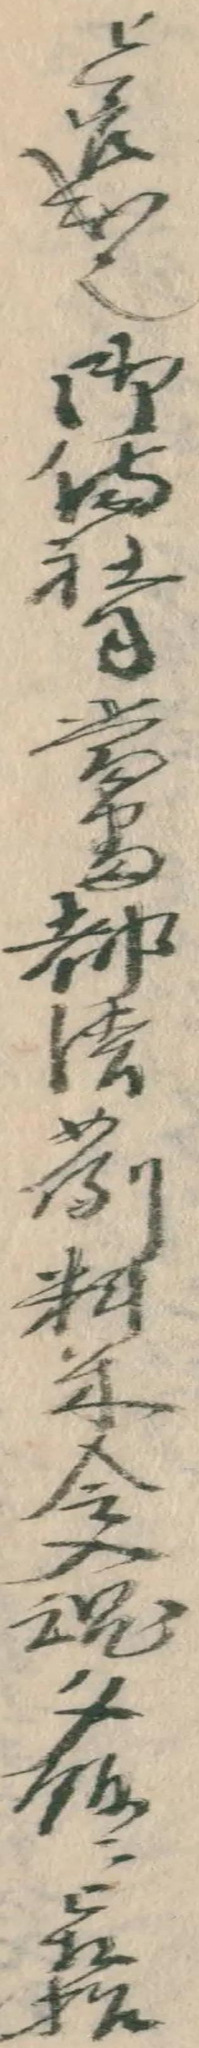被差出也御備社用當番都清如例料米令入魂夕飯ニ被相招
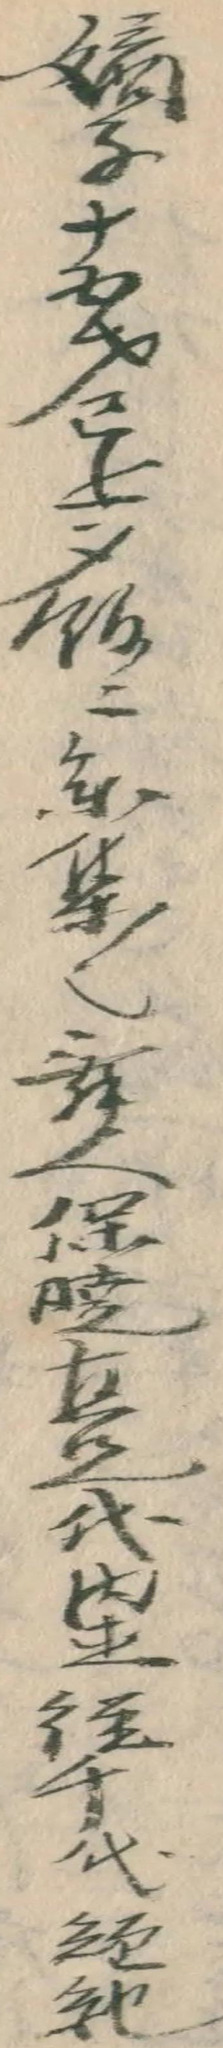嫡子十五才已上夕飯二参集也舞人保暁直兄代内直経千代経紀
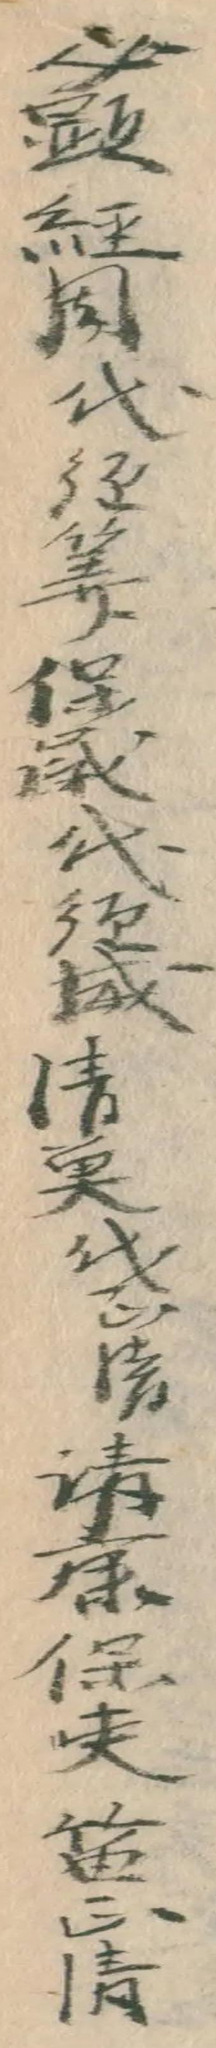必顕顕周代経筭保歳代経威清魚代正清清康保吏笛正清

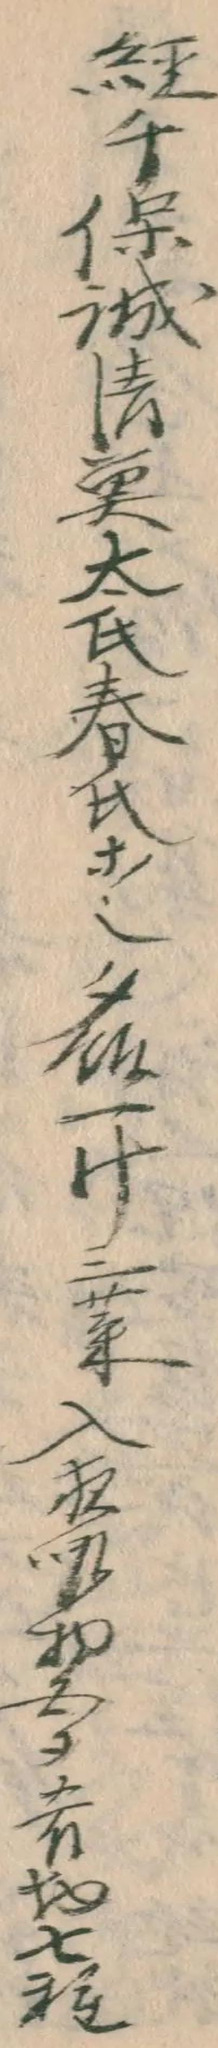経千保誠清魚太氏春氏等也夕飯一汁三菜入夜吸物五ツ肴物七種
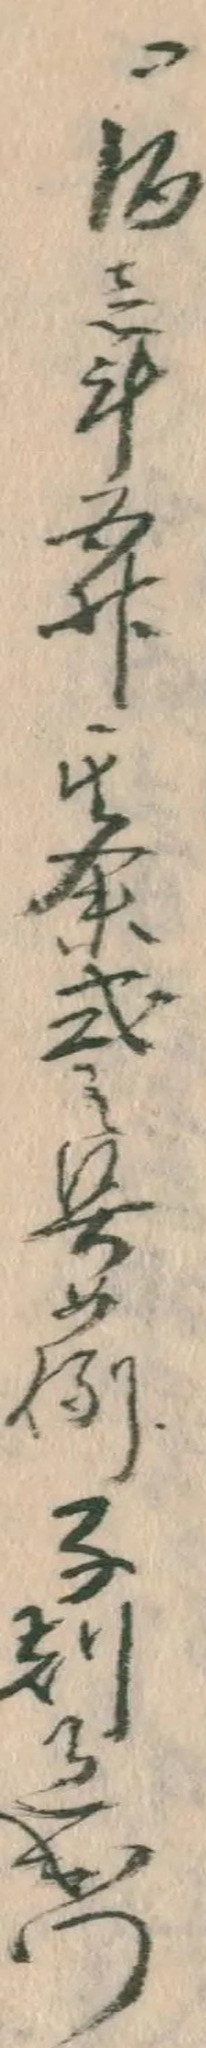御酒壱斗五升其余式之奥如例子刻過出門
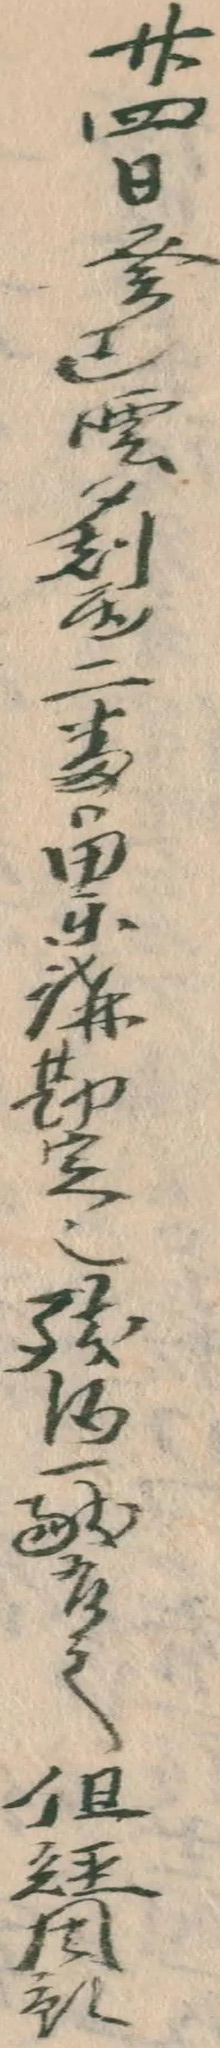廿四日癸巳曇夕刻雨二番御田楽講勘定也残酒一献有之但経周願
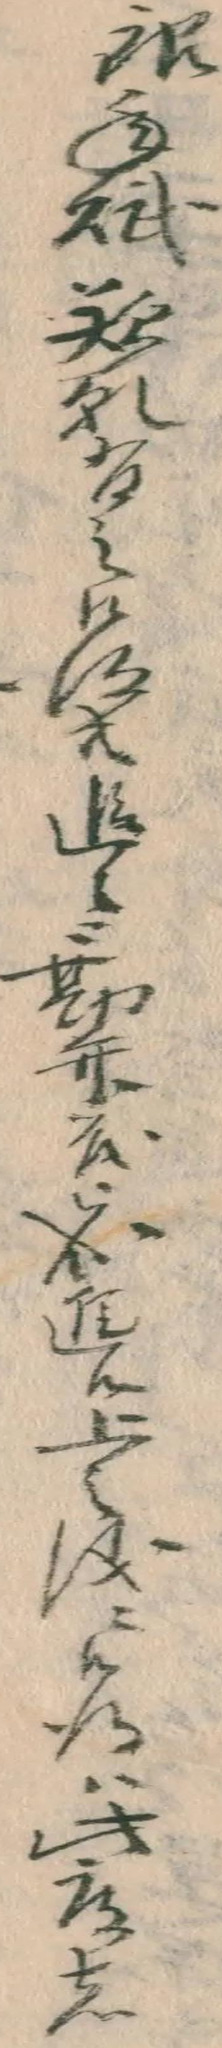銀年賦歎願有之候得共追々御勘弁も被成進候上之儀ニ候得ハ此度者
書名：賀茂社記録. 第69冊
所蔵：国立国会図書館 National Diet Library, JAPAN
